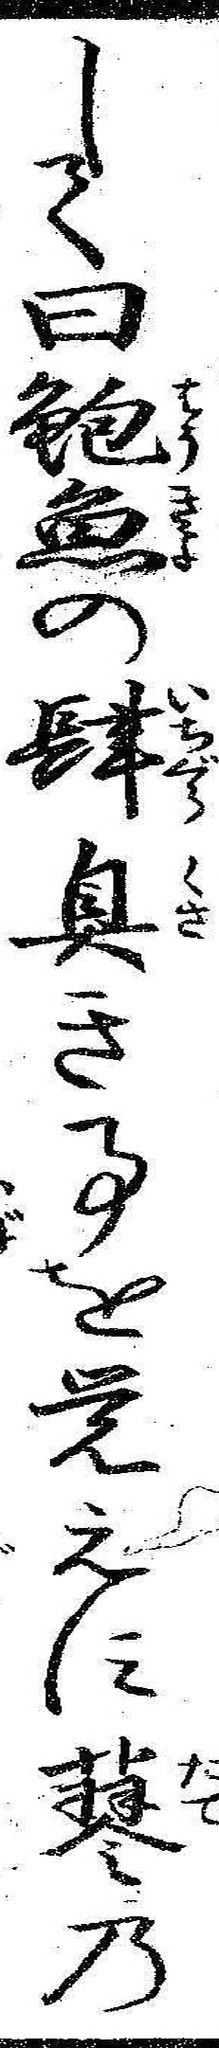して曰鮑魚の肆臭き事を覚えす蓼の
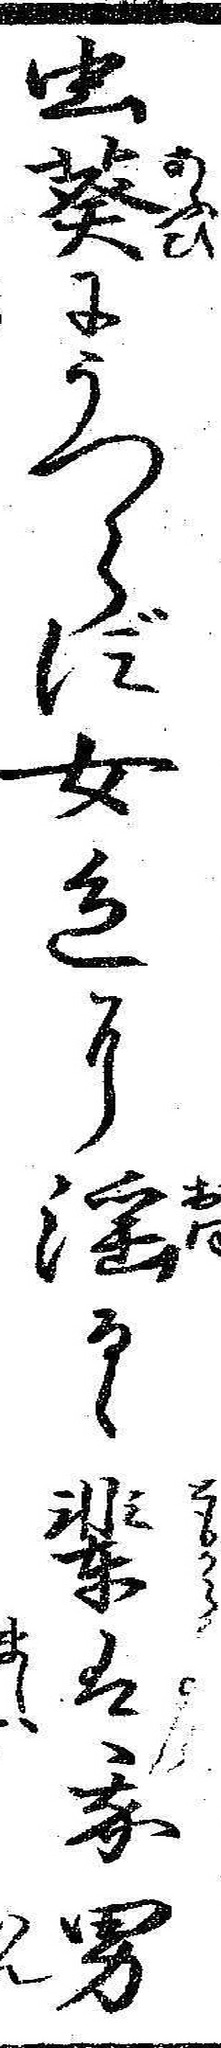虫葵にうつらず女色に淫るゝ輩は我男
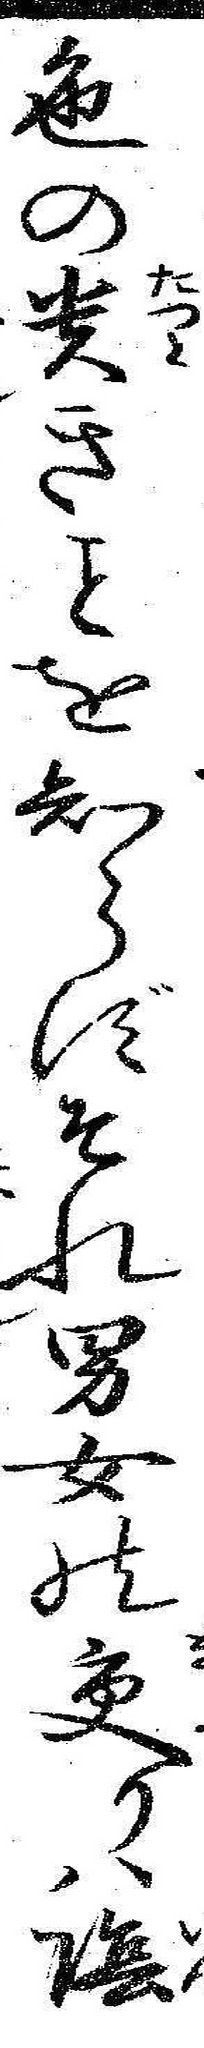色の貴きを知らずそれ男女の交りは陰
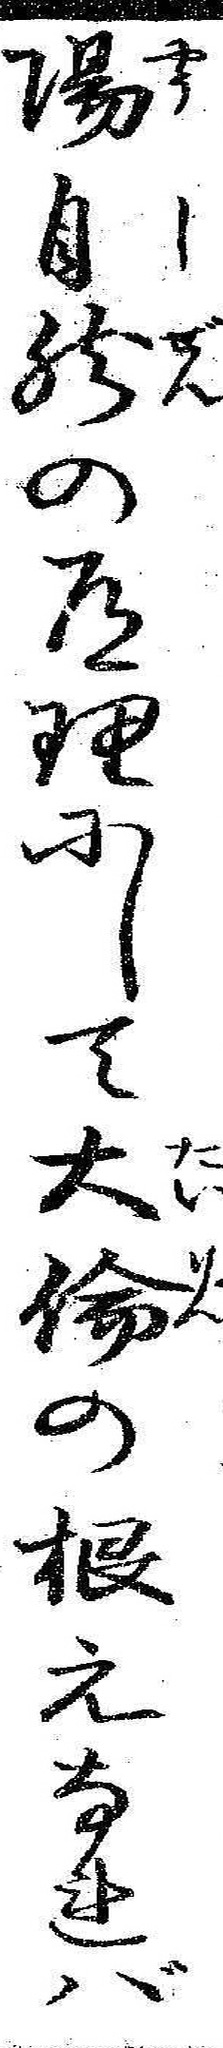陽自然の道理にして大倫の根元なれば
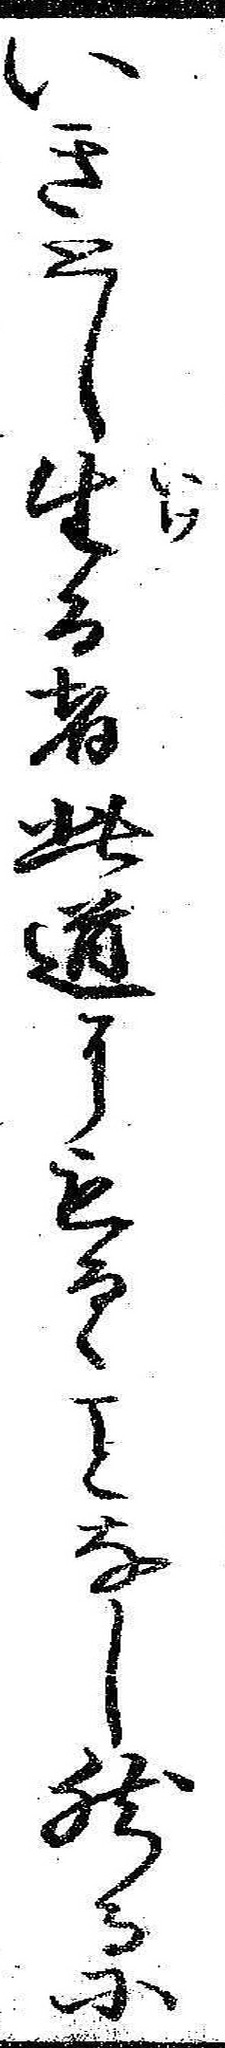いきとし生る者此道にもるゝことなし然るに
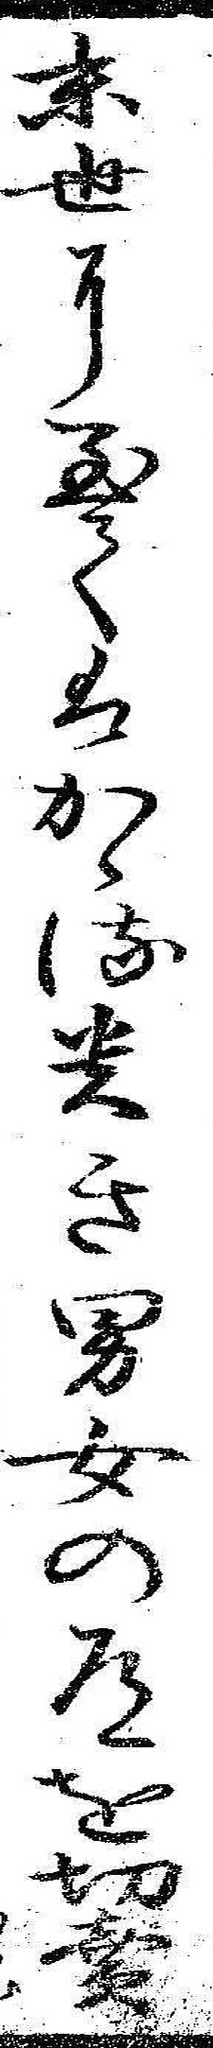末世に至てはかゝる貴き男女の道を切売
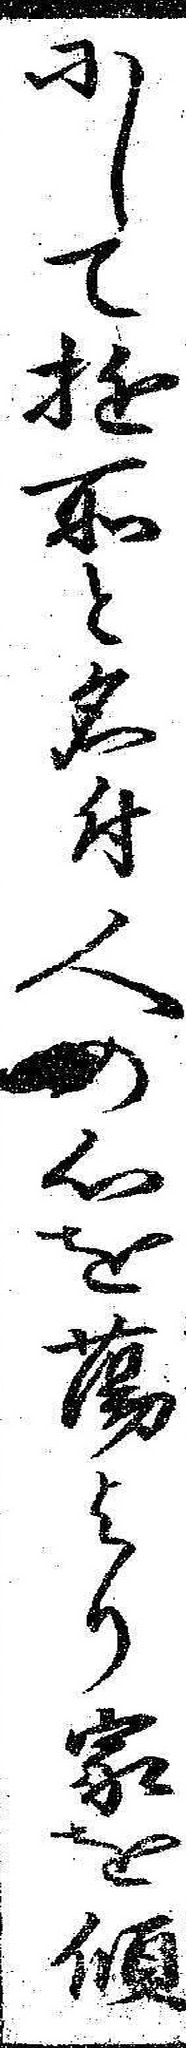にして遊所と名付人の心を蕩より家を傾

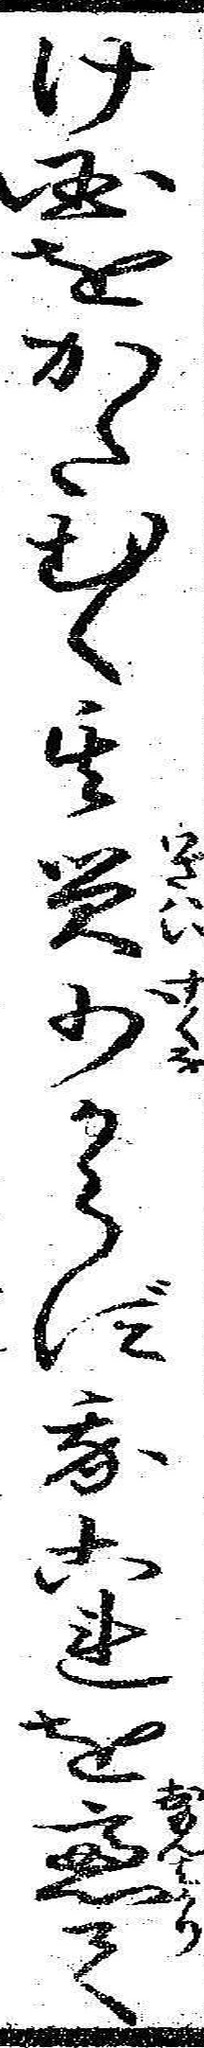け国をかたむく其災少からず我これを慮て
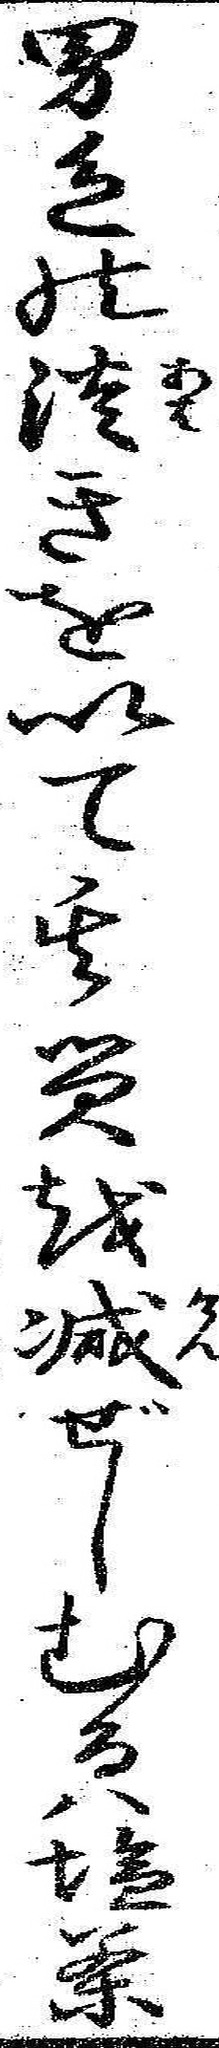男色の淡きを以て其災を減ぜしむるは塩茶
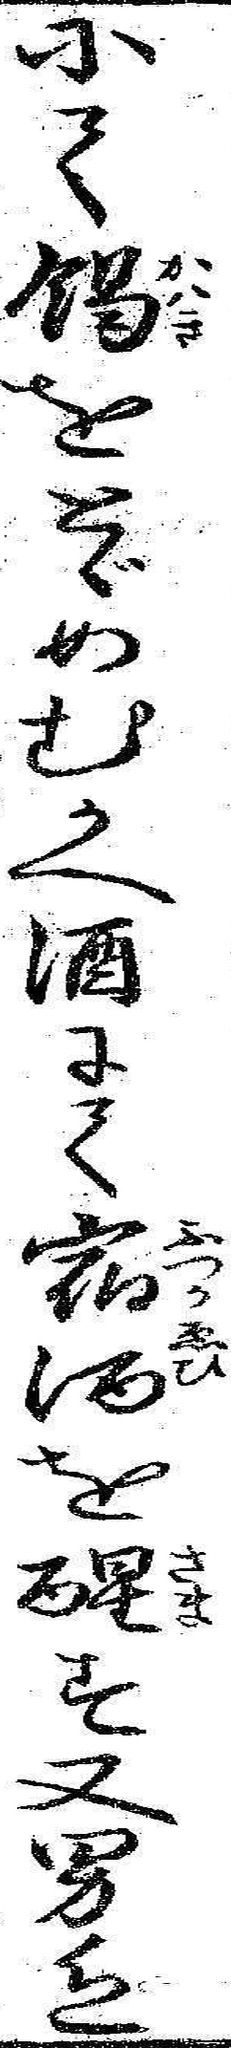にて渇をとゞめむかへ酒にて宿酒を醒す又男色
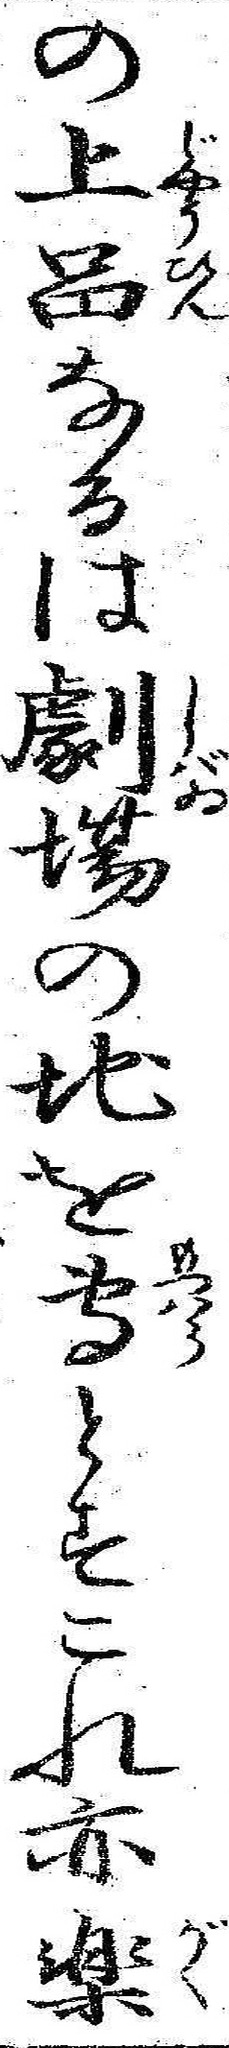の上品なるは劇場の地を専とすこれ亦楽
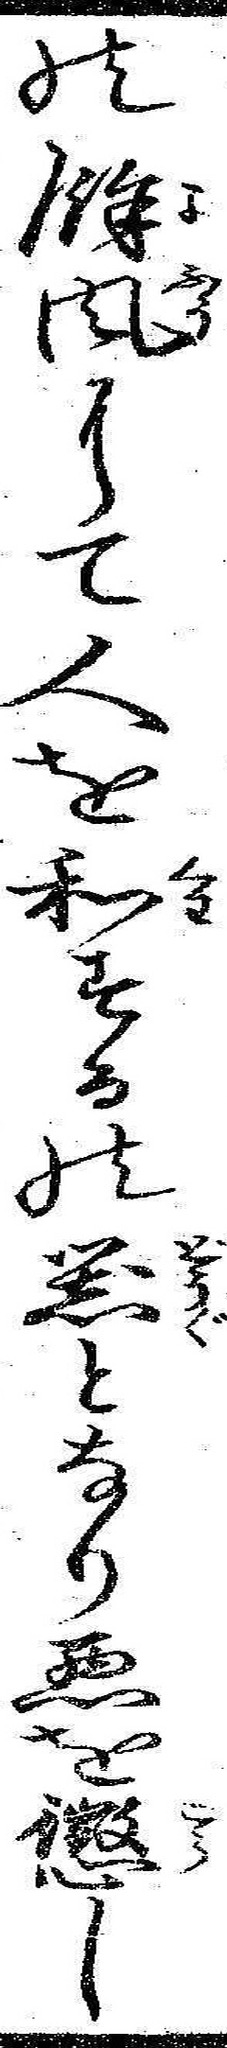の余風にて人を和するの器となり悪を懲し
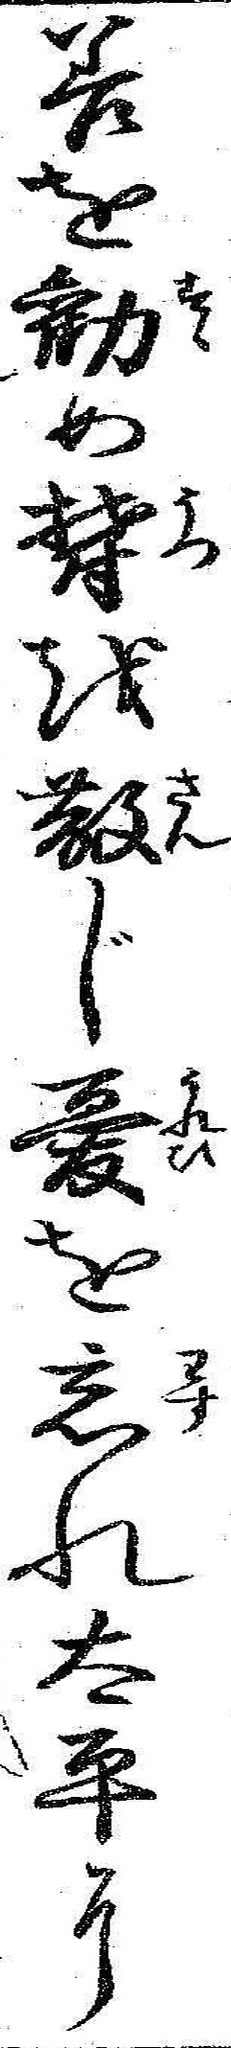善を勧め欝を散じ憂を忘れ太平に
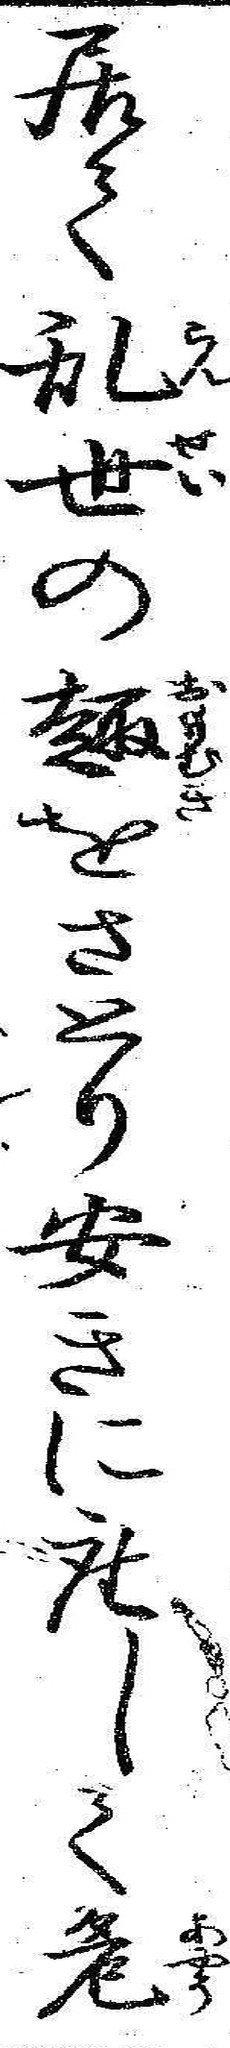居て乱世の趣をさとり安きに座して危
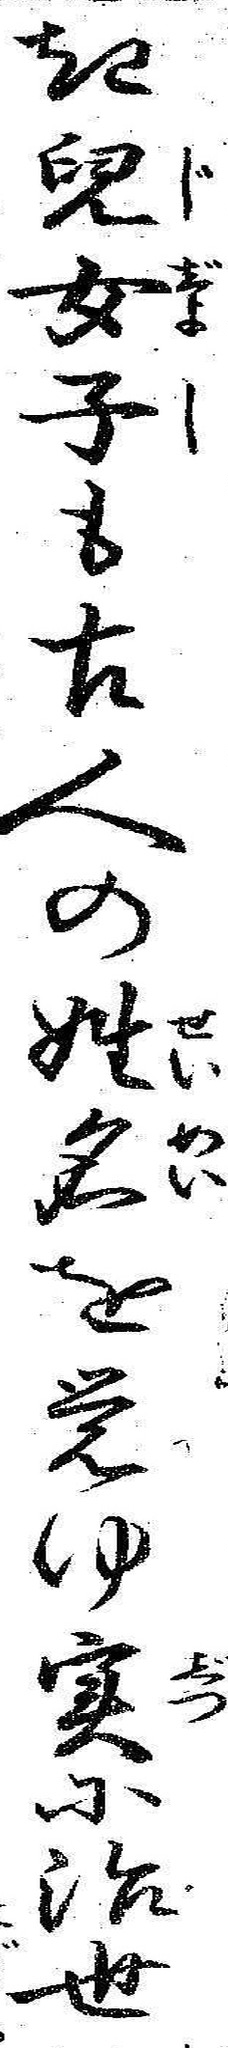き児女子も古人の姓名を覚ゆ実に治世
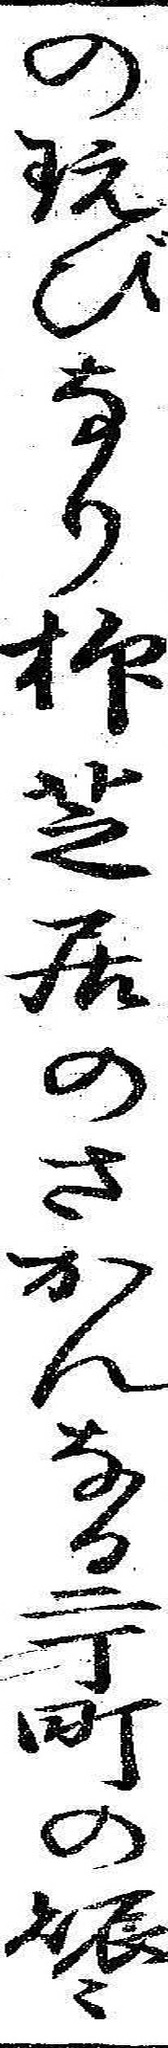の玩びなり抑芝居のさかんなる二丁町の賑々
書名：根無草後編
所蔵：国文学研究資料館
